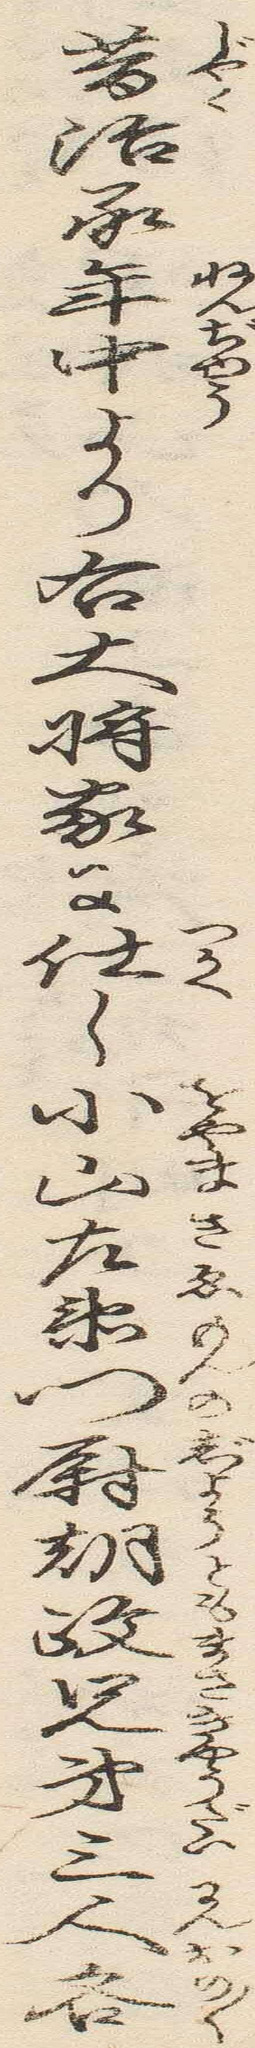昔治承年中より右大将家に仕し小山左衛門尉朝政兄㐧三人各
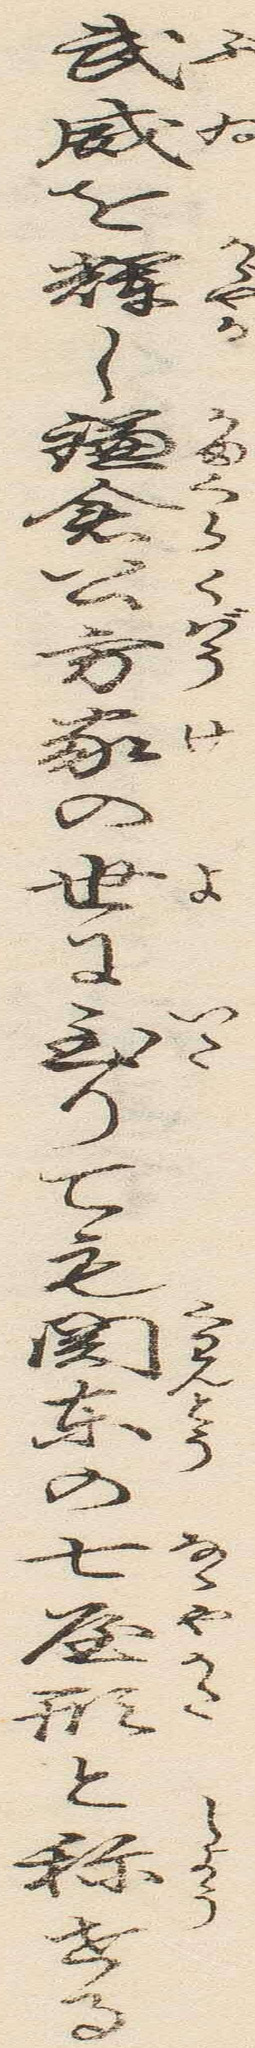武威を輝し鎌倉公方家の世に至りても関東の七屋形と称せる
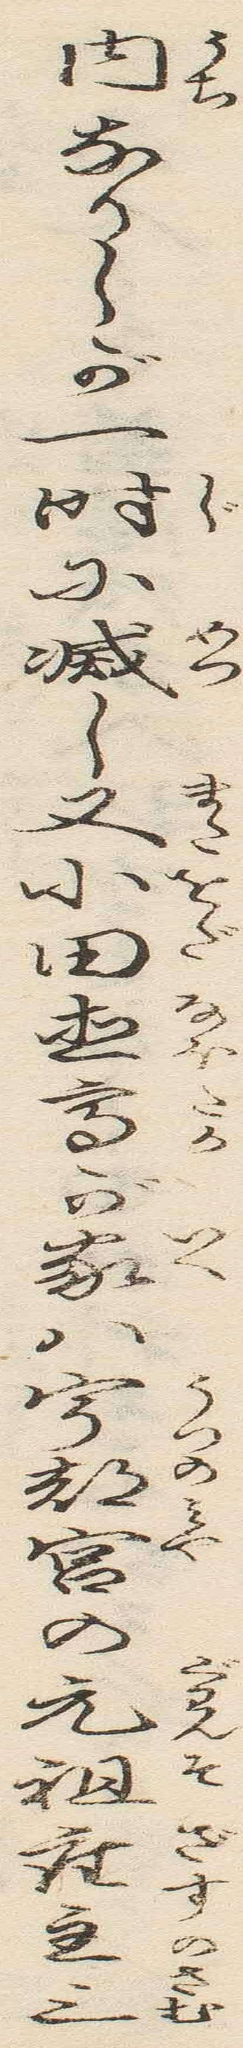内なりしが一时に滅し又小田直高が家は宇都宮の元祖座主三
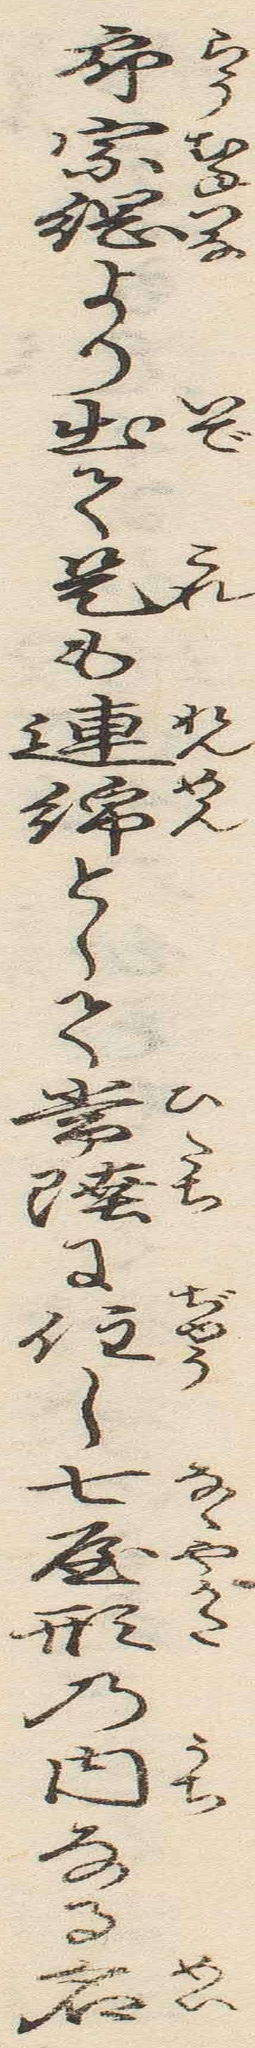郎宗綱より出て是も連綿として常陸に住し七屋形の内なる名
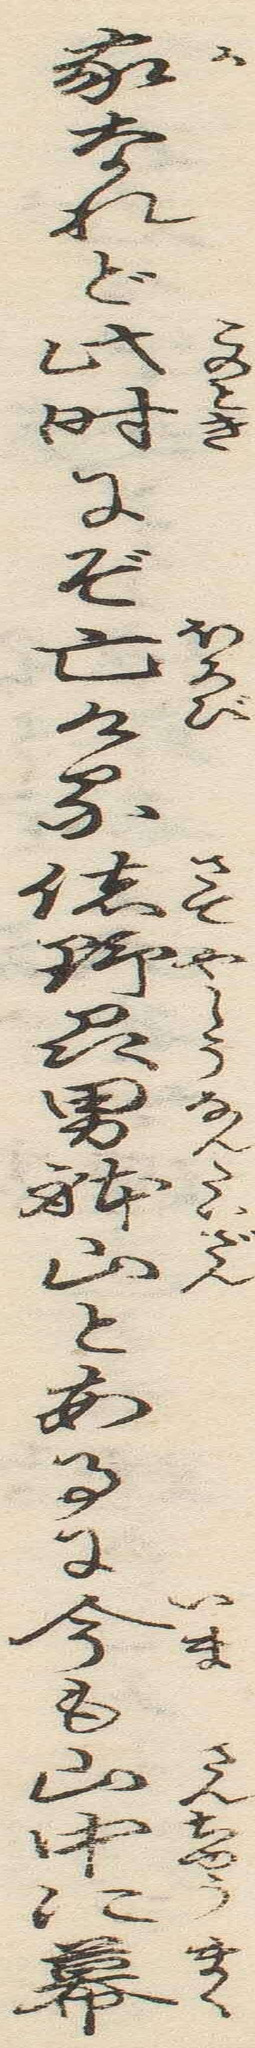家なれど此时にぞ亡ける偖野刕男躰山とあるに今も山中に幕
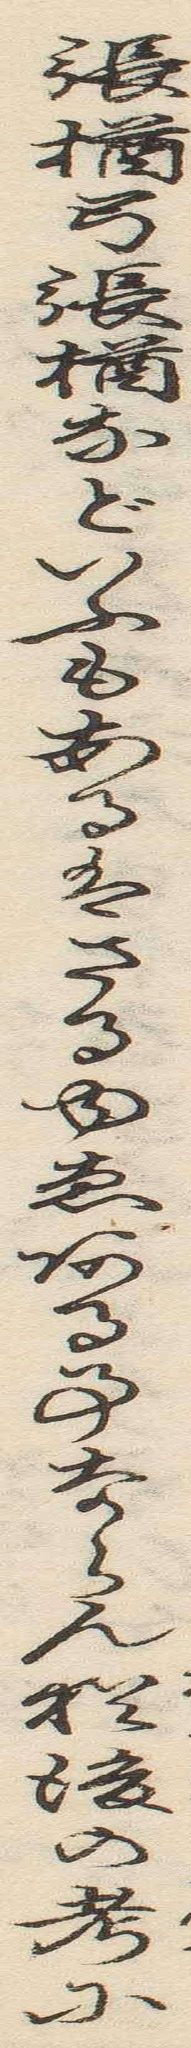張楢弓張楢などいふもあるはさるゆゑある事ならん猶後の考に
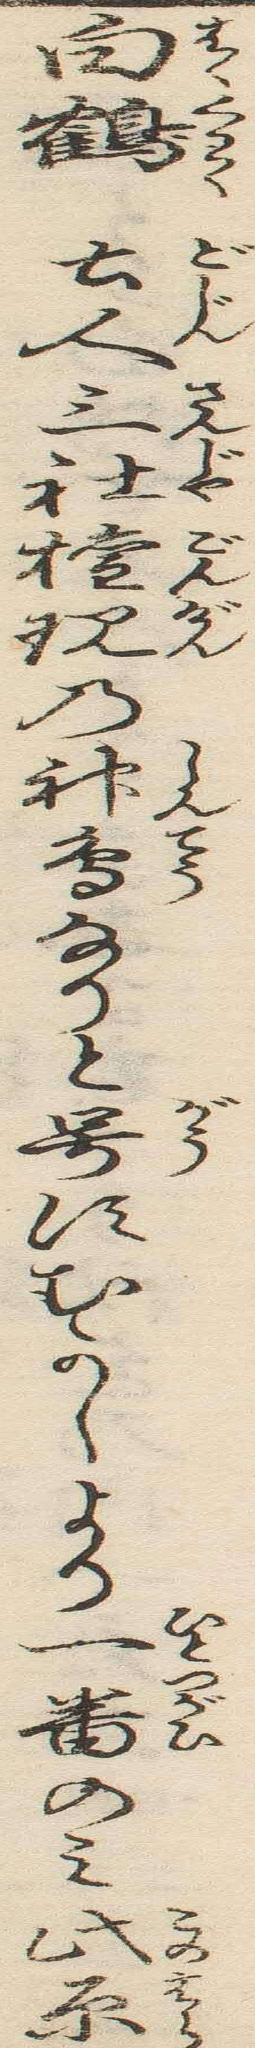白鶴土人三社權現の神鳥なりと号すむかしより一番のみ此原
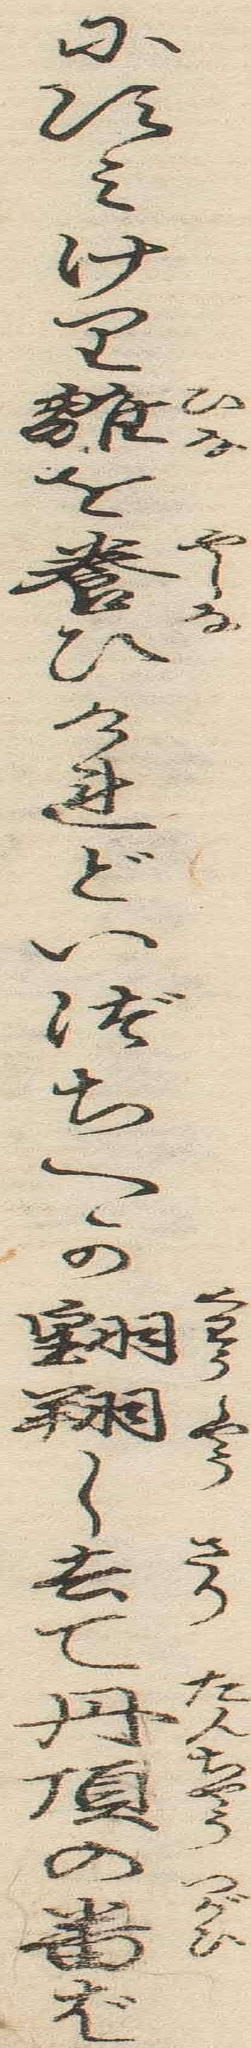にすみけり雛を養ひけれどいづちへか翶翔し去て丹頂の番ば
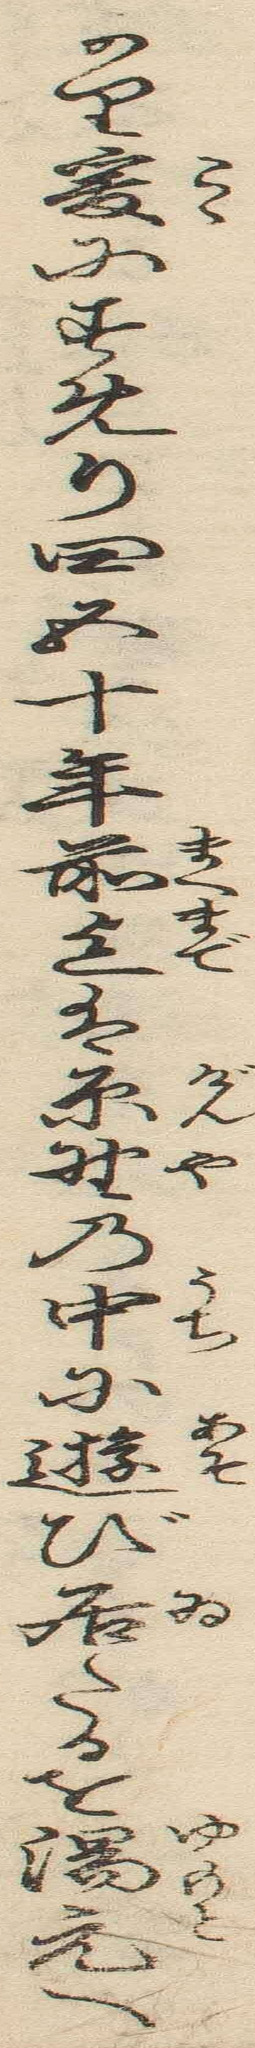かり爰にすめり四五十年前迄は原㙒の中に逰び居たるを湯元へ

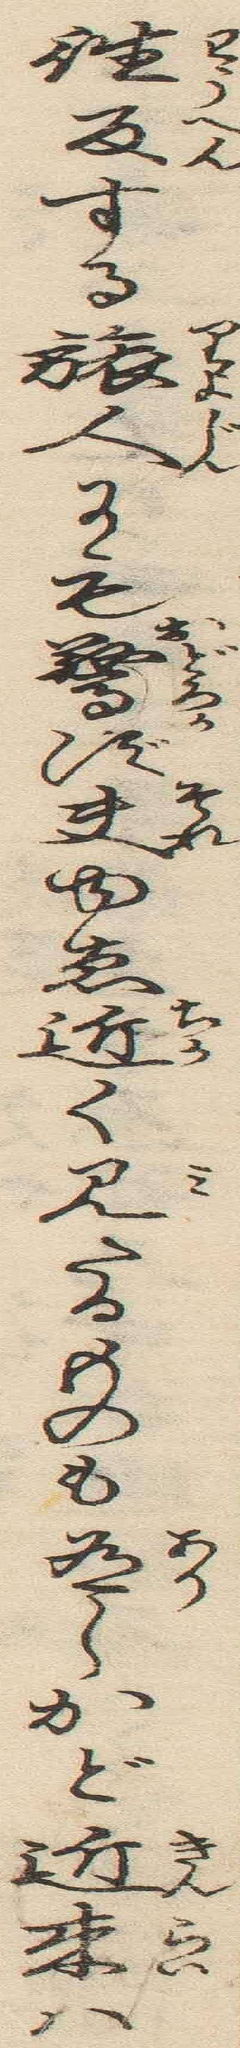徃反する旅人にも驚ず夫ゆゑ近く見たるものも有しかど近來は
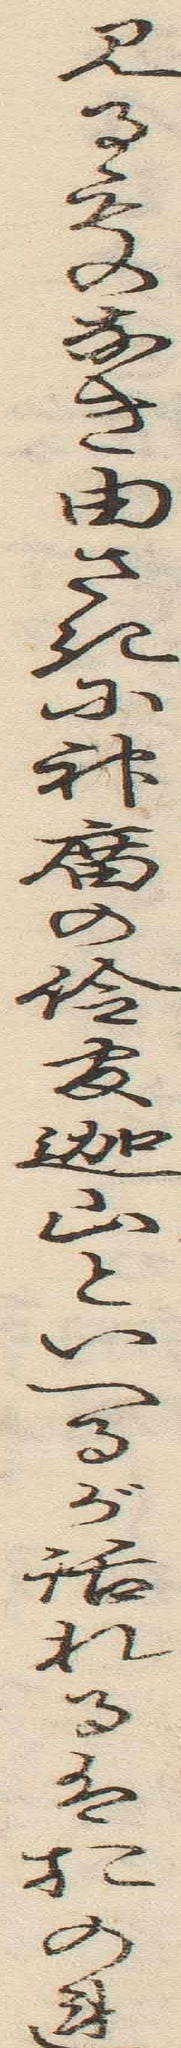見るものなき由さきに神庿の伶官迦山といへるが話れるはおのれ
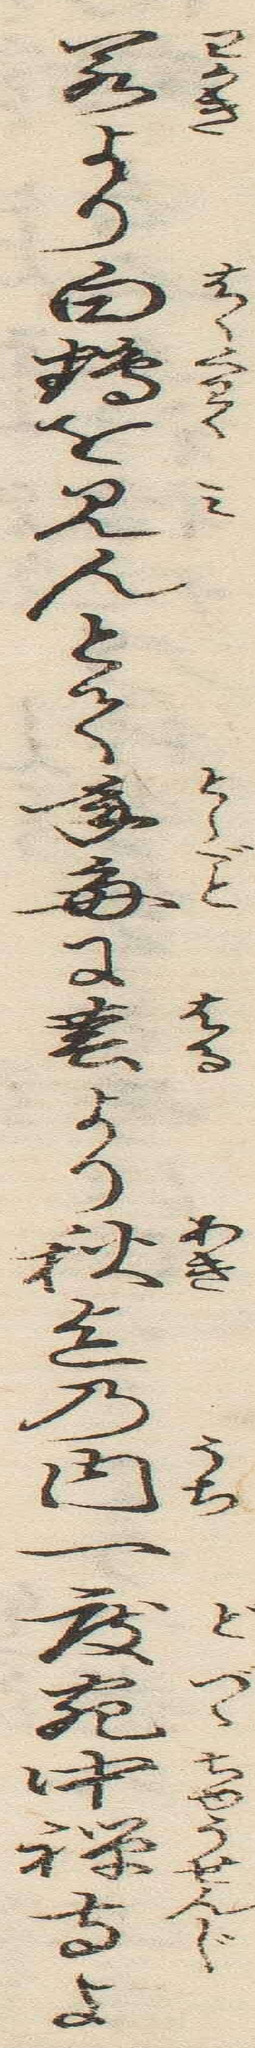若より白鶴を見んとて年毎に春より秋迄の内一度宛中禅寺よ
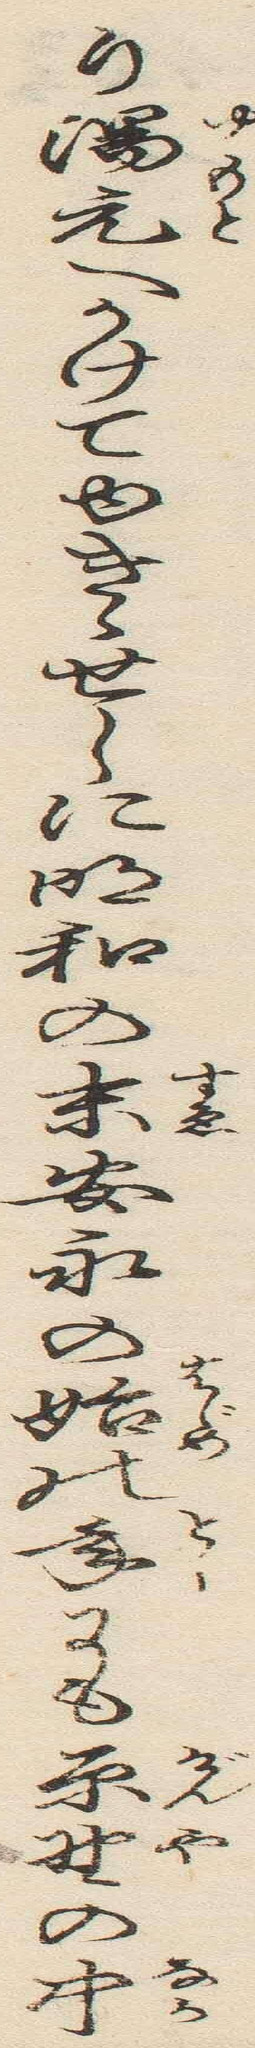り湯元へかけてゆきゝせしに明和の末安永の始の年にも原㙒の中
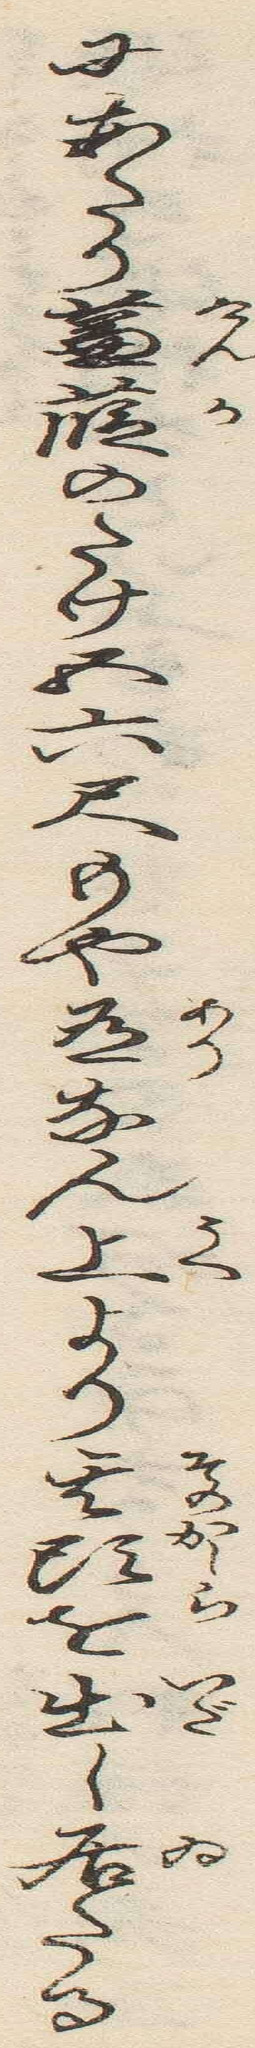にあたり蒹葭のたけ五六尺もや有なん上より其頭を出し居たる
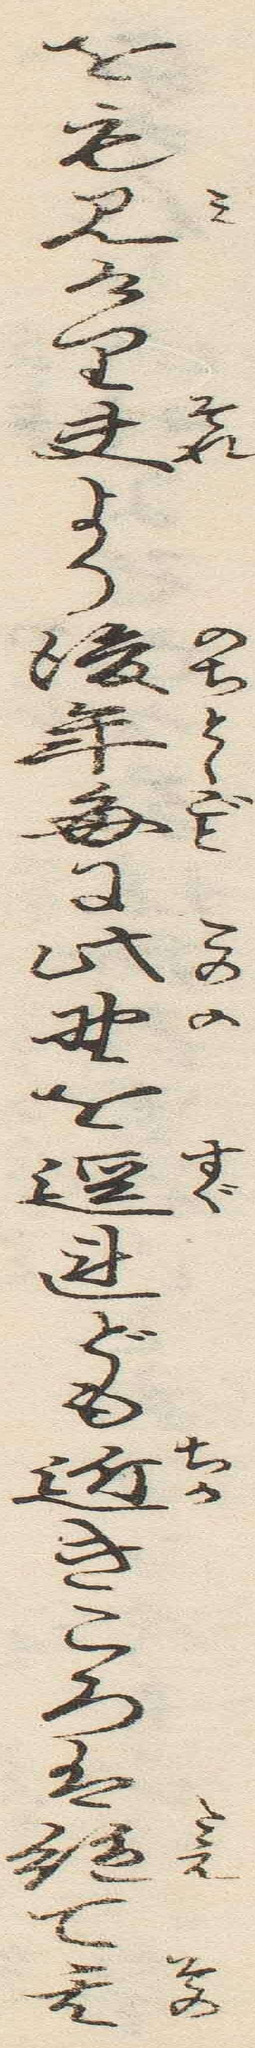をも見けり夫より後年毎に此㙒を逕れども近きころは絶て其
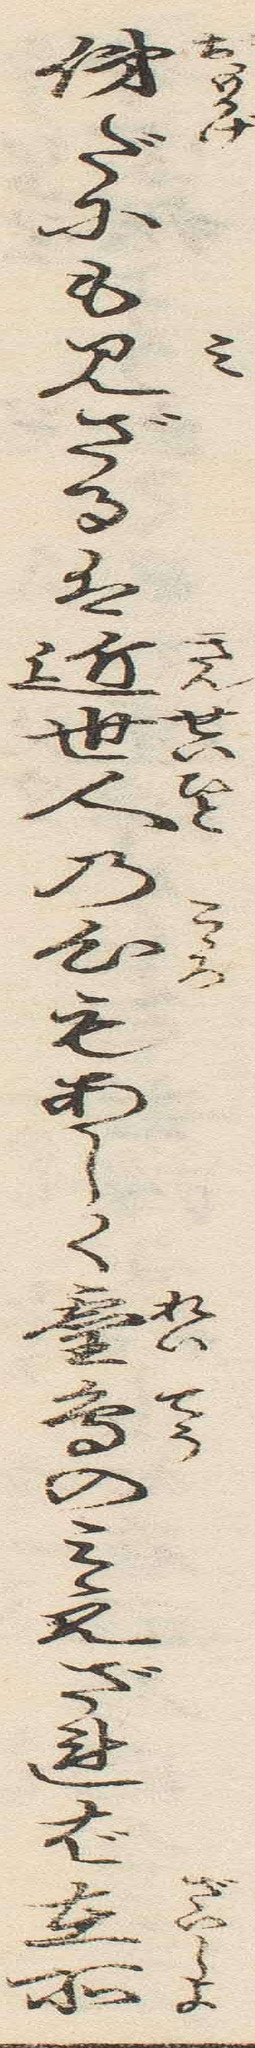俤だにも見ざるは近世人の心もあしく靈鳥のみえざれば在所
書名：日光山志
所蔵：東京学芸大学附属図書館 国文学研究資料館
